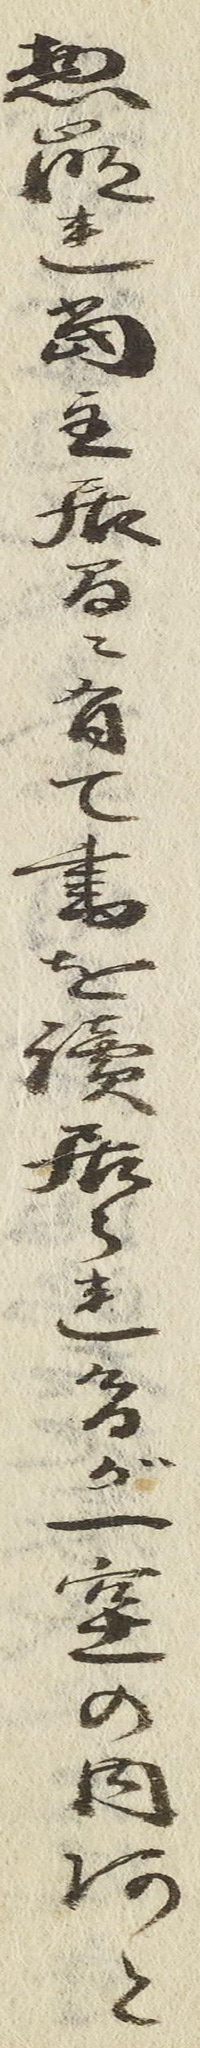惣崩れ当主居間ニ有て書を読居られけるが一空の内あと
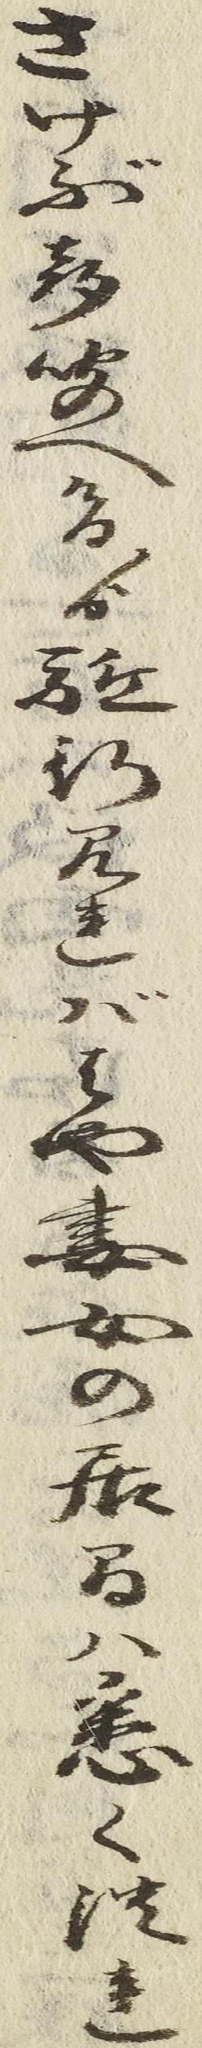さけぶ声聞へけるゟ駈行見ればはや妻女の居間は悉く潰れ
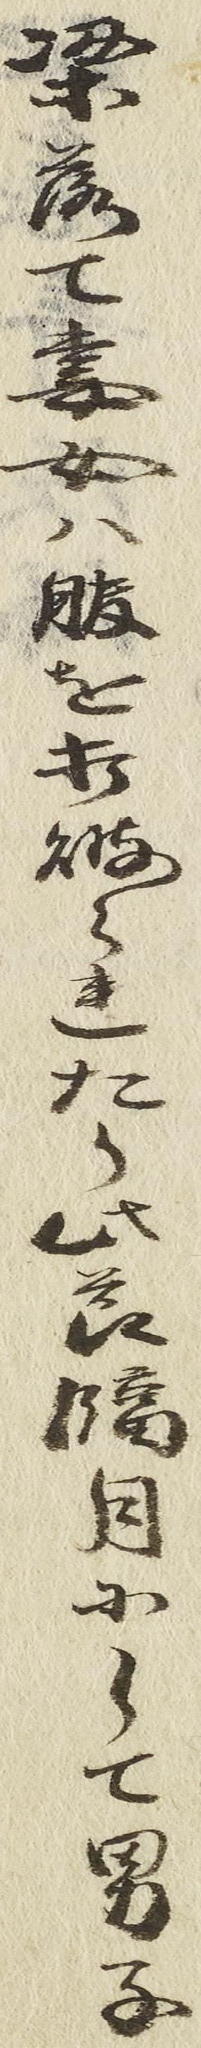梁落て妻女は服を打破られたり此節臨月にして男子
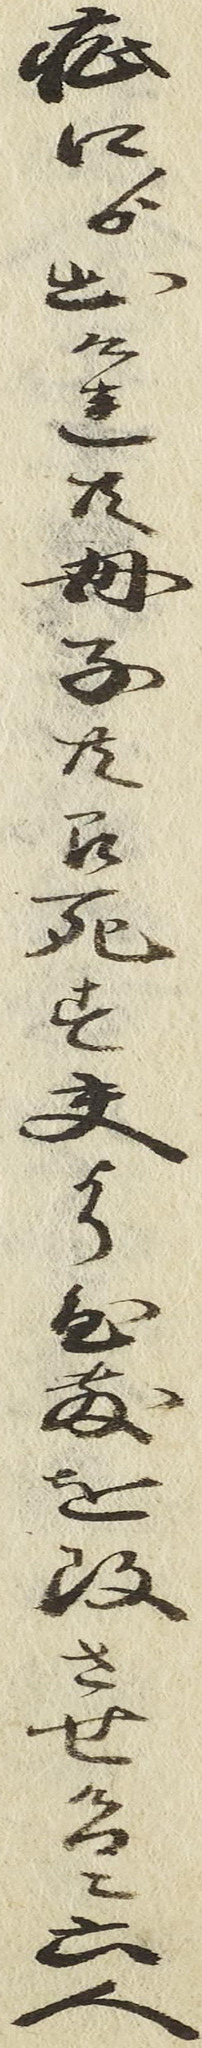疵口ゟ出けれ共母子共即死す夫より屋敷を改させけるニ六人
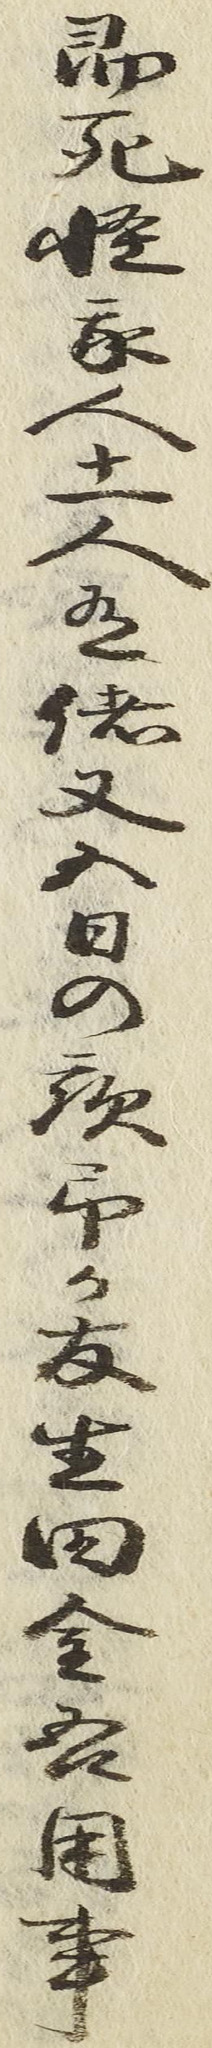即死怪我人十一人有偖又五日の夜予か友生田金吾用事
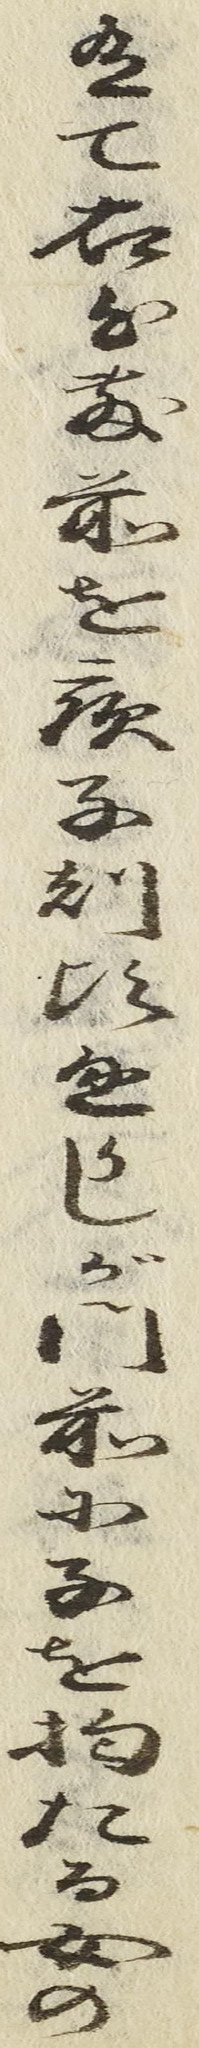有て右屋敷前を夜子刻頃通りしが門前に子を抱たる女の
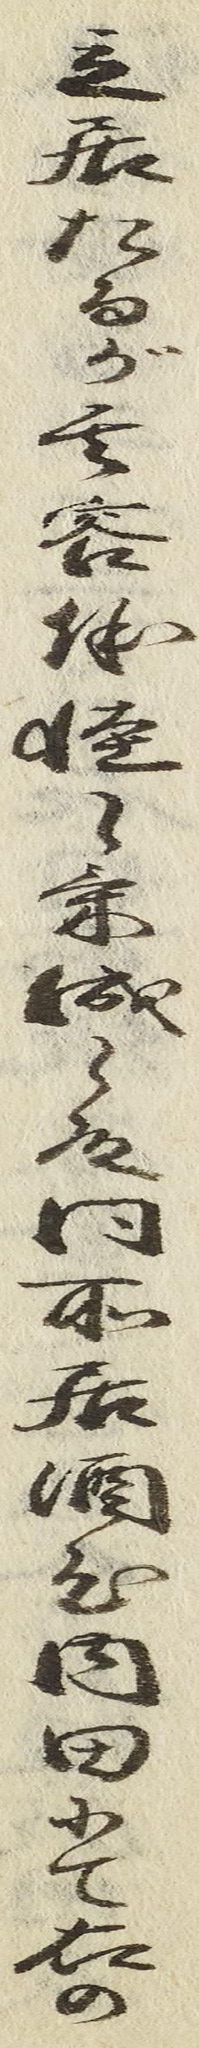立居たるが其容体怪し気成し故同所居酒屋内田にて右の
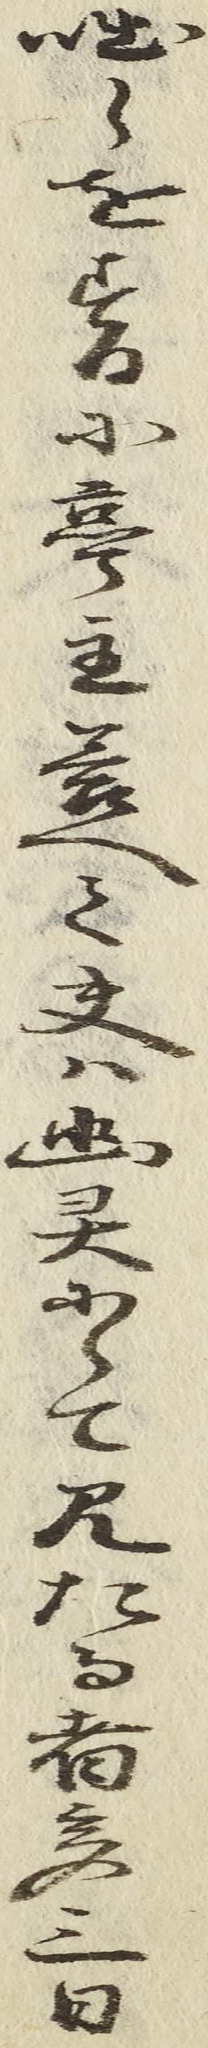咄しをするに亭主答へて夫は幽霊にして見たる者多三日
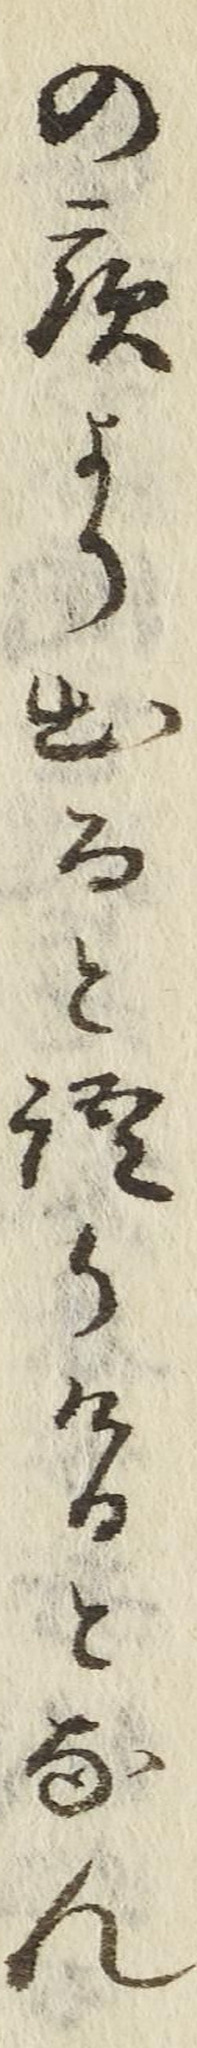の夜より出ると語りけるとなん
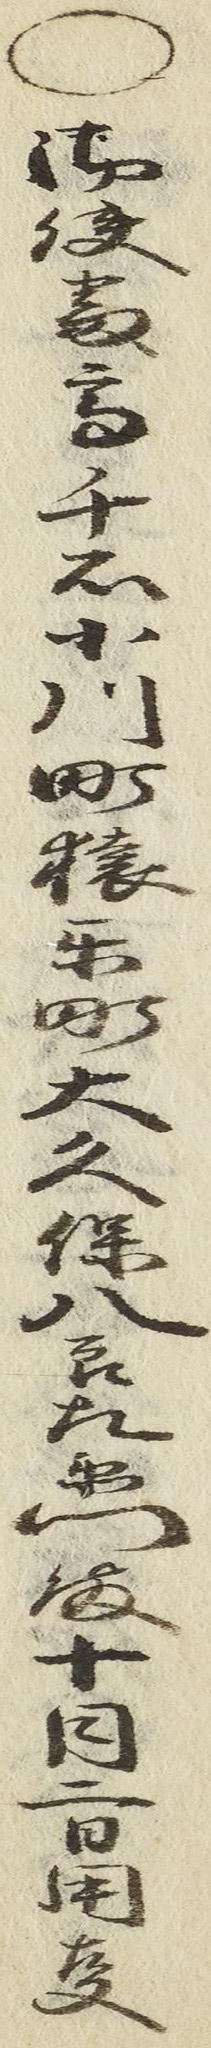○御使番高千石小川町猿楽町大久保八郎左衛門殿十月二日用事
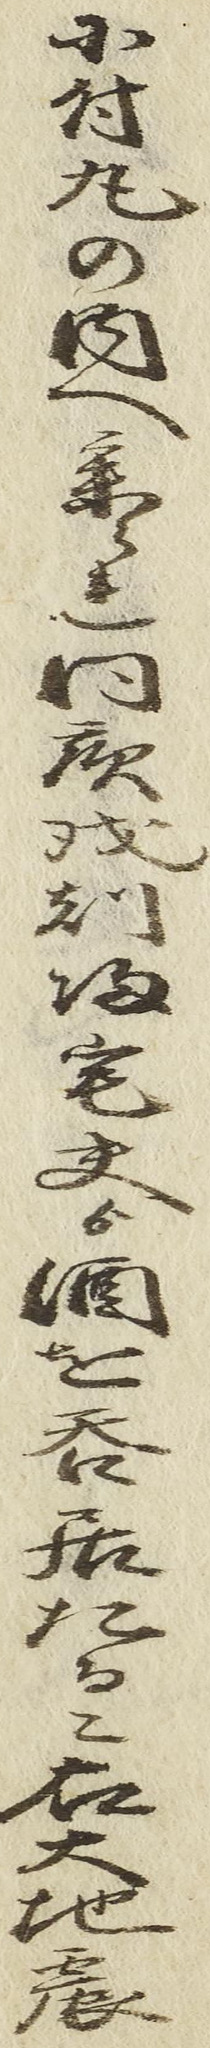に付丸の内へ参られ同夜戌刻帰宅夫ゟ酒を呑居たるニ右大地震
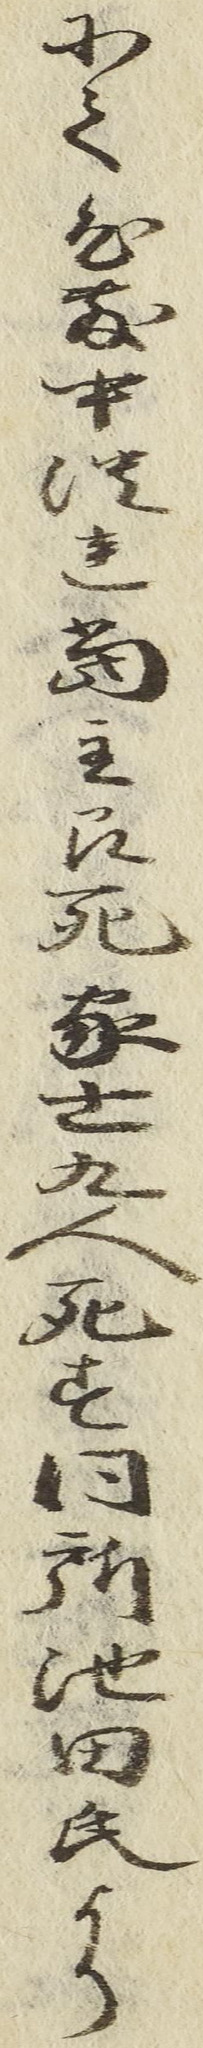にて屋敷中潰れ当主即死家士九人死す同所池田氏より
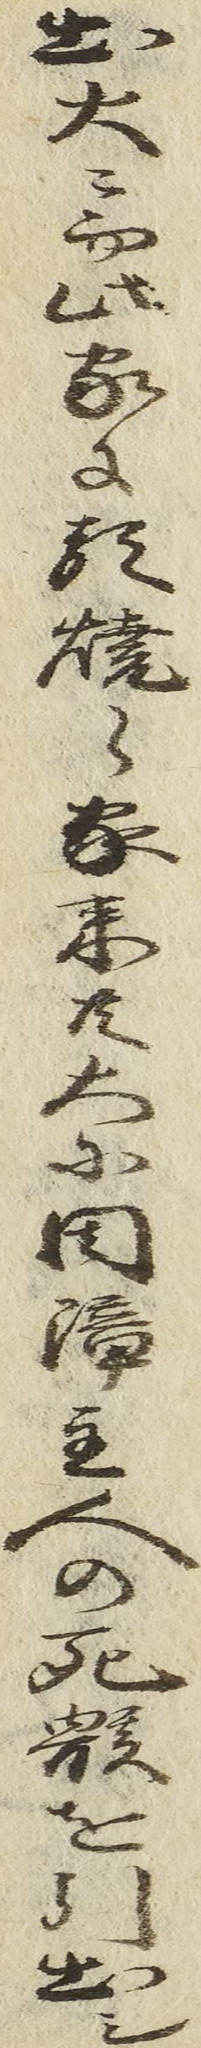出火ニ而此家に類焼し家来共大に固障主人の死骸を引出し

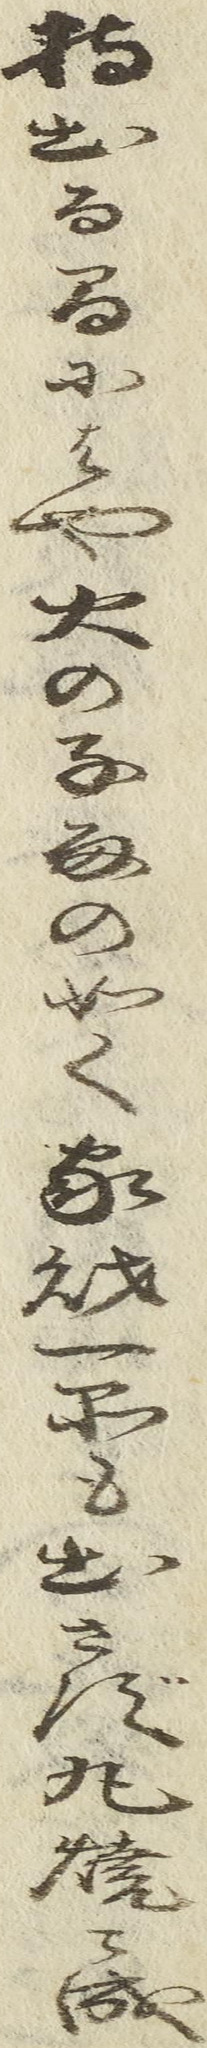持出る間にははや火の子雨の如く家財一品も出さず丸焼ニ成
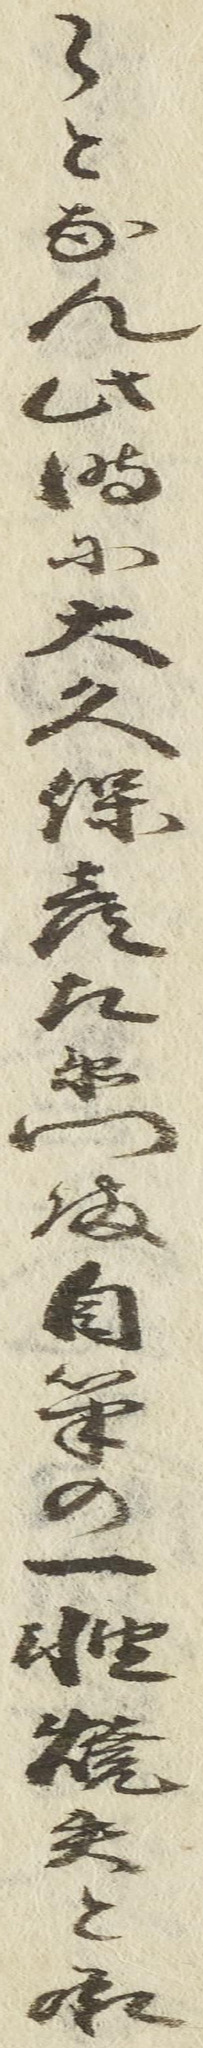しとなん此時に大久保彦左衛門殿自筆の一軸焼失と承
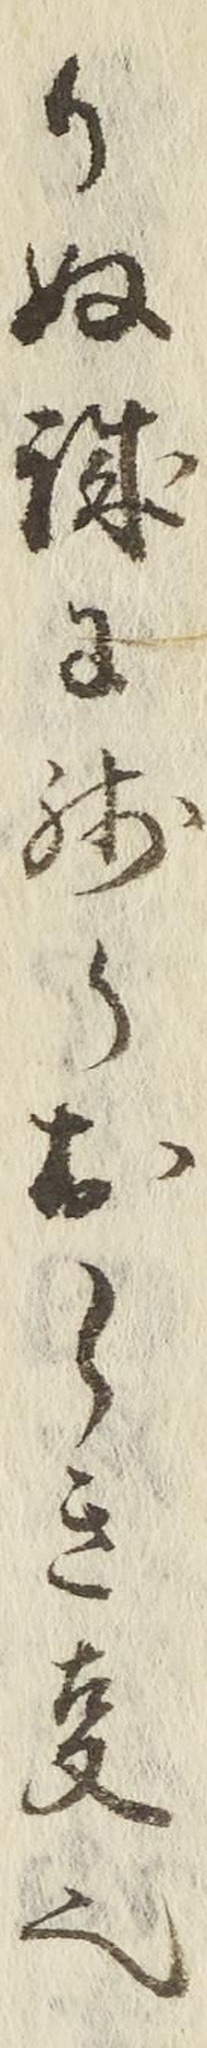りぬ誠に残りおしき事也
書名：安政二年震災記事　完
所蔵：東京大学地震研究所図書室 Earthquake Research Institute Library, The University of Tokyo, JAPAN
